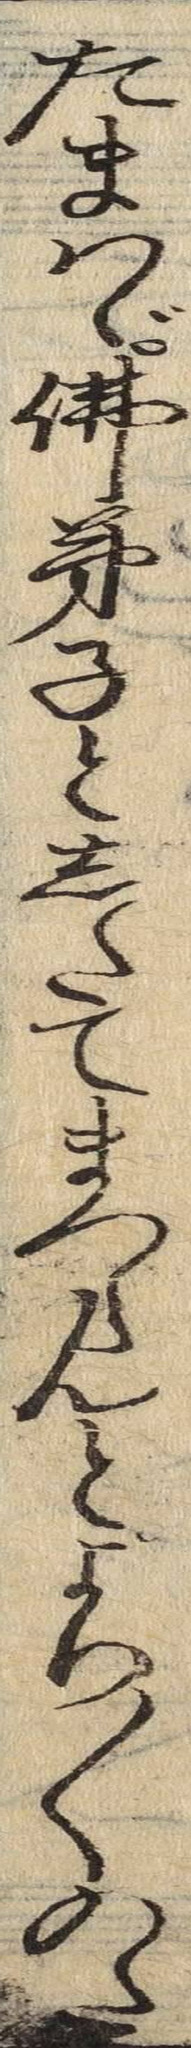たまはゞ。仏弟子としたてまつらんと。より〳〵のた
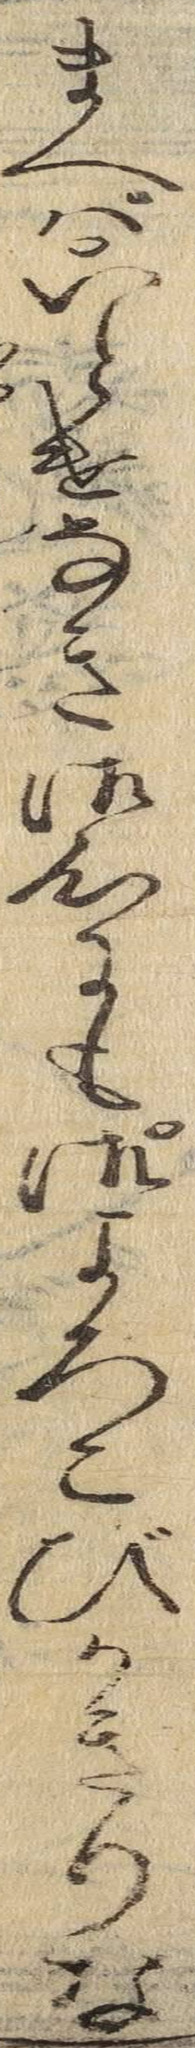まへば。いとけなき御心にも。御よろこびかきりな
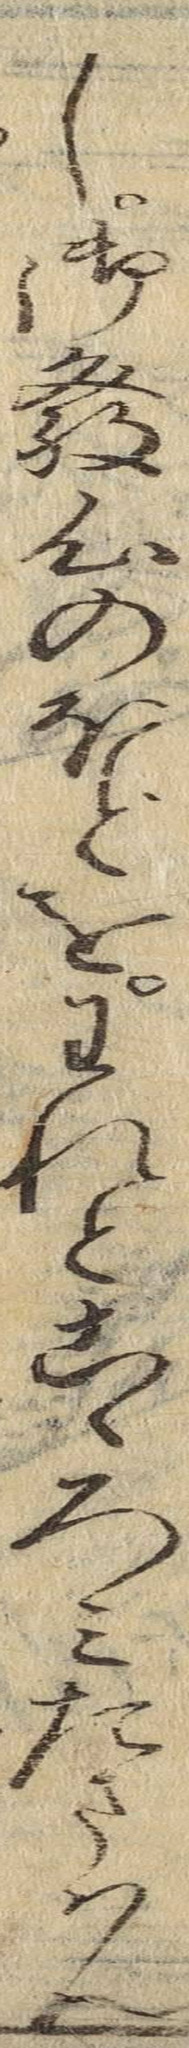し。御発心のほどを。われとこゝろみたまはん
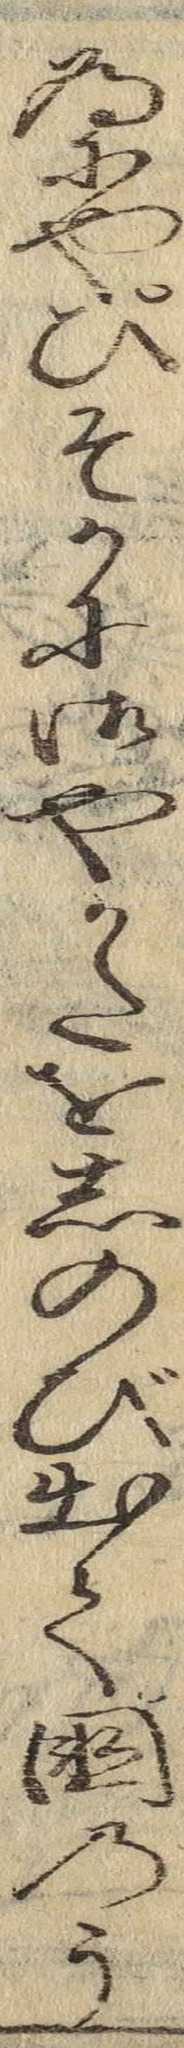為にや。ひそかに御やかたをしのび出て国のう
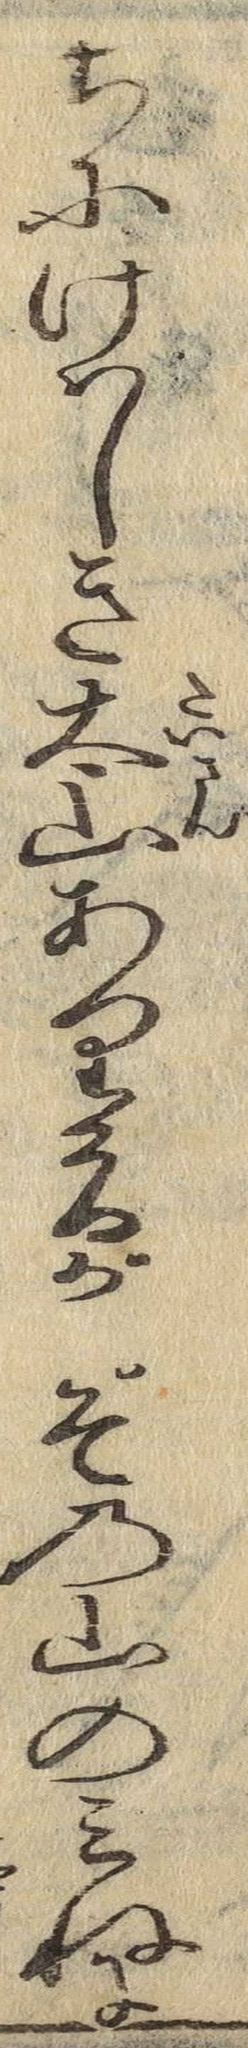ちにけはしき太山ありけるが。その山のみねに
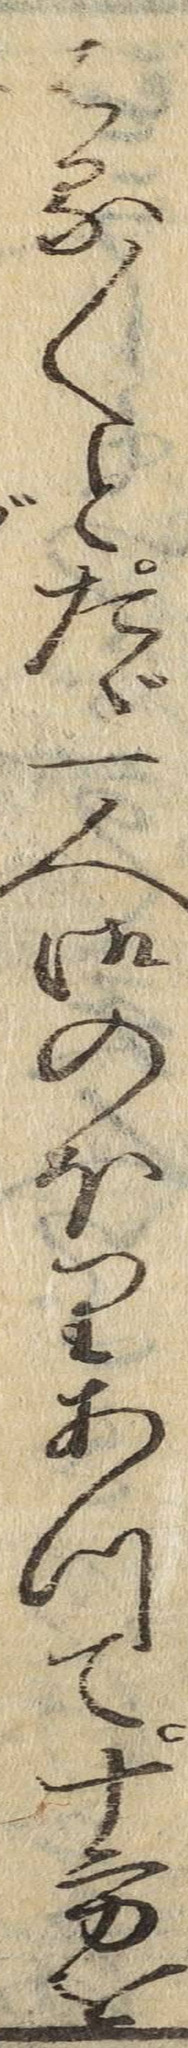はる〳〵とたゞ一人御のほりあつて十方を
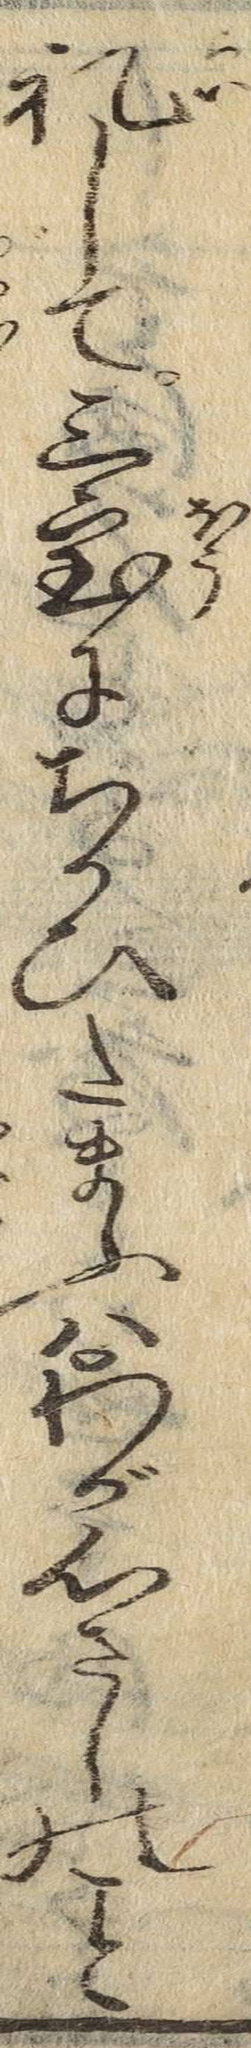礼して。三宝にちかひたまふは。わが心さしのこと
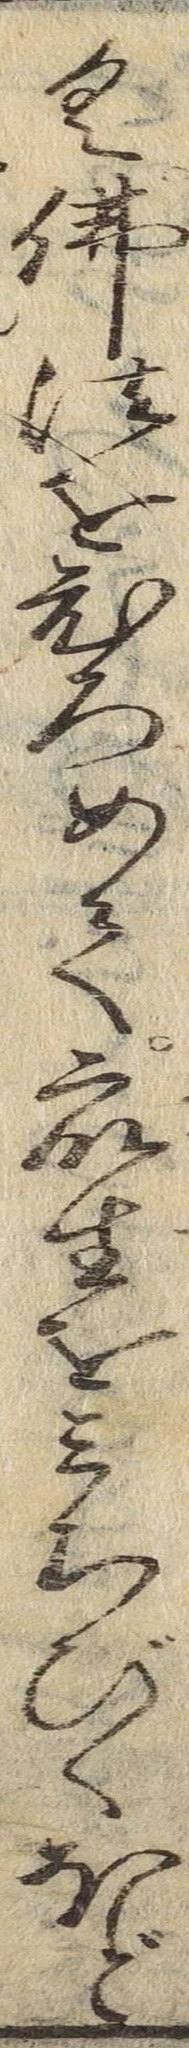く。仏法をひろめて。衆生をみちびくほど
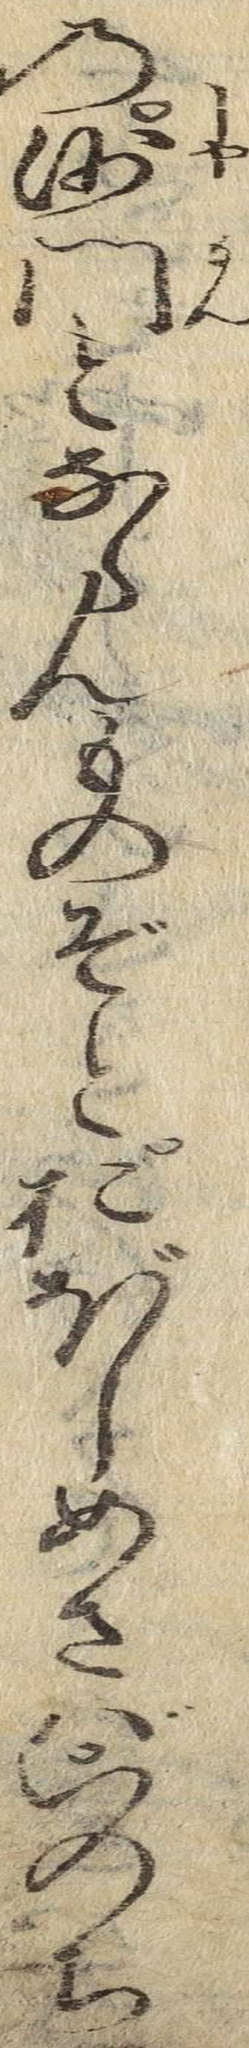の沙門とならんものぞと。おぼしめさばいのち
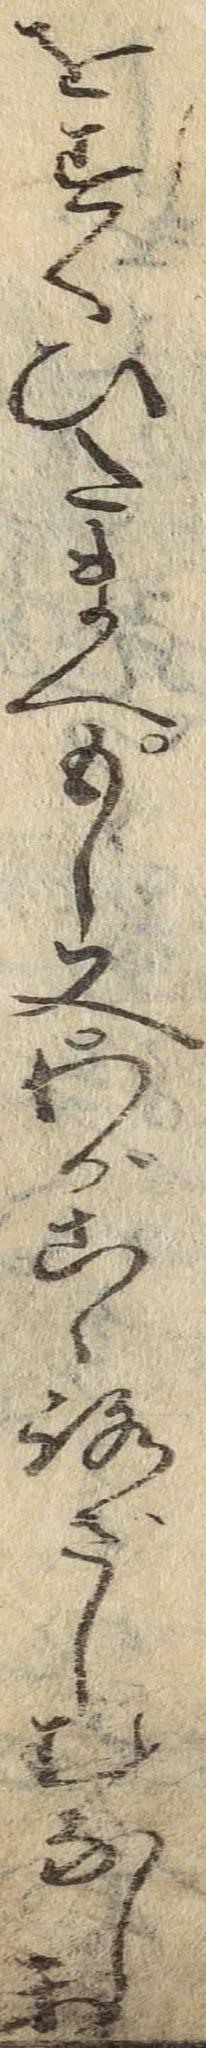おすくひたまへ。もし又。わがこゝろざしむなしか
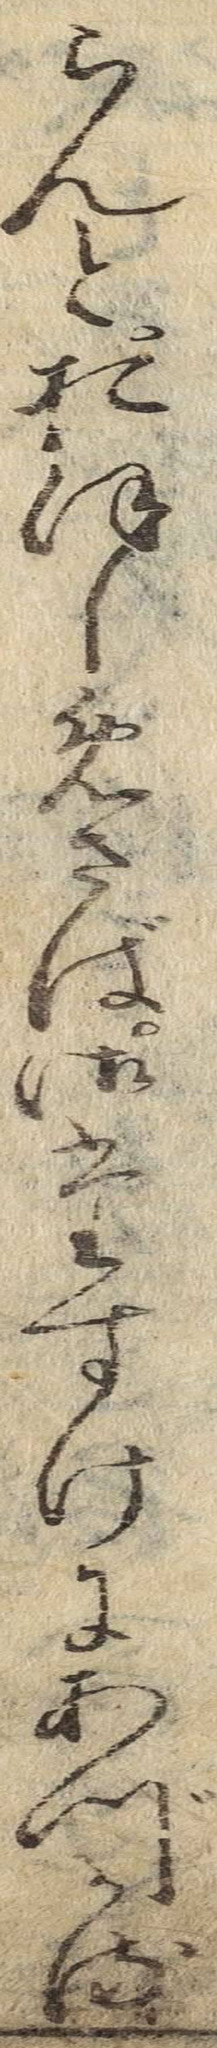らんとおほしめさば。御たすけにあつかる
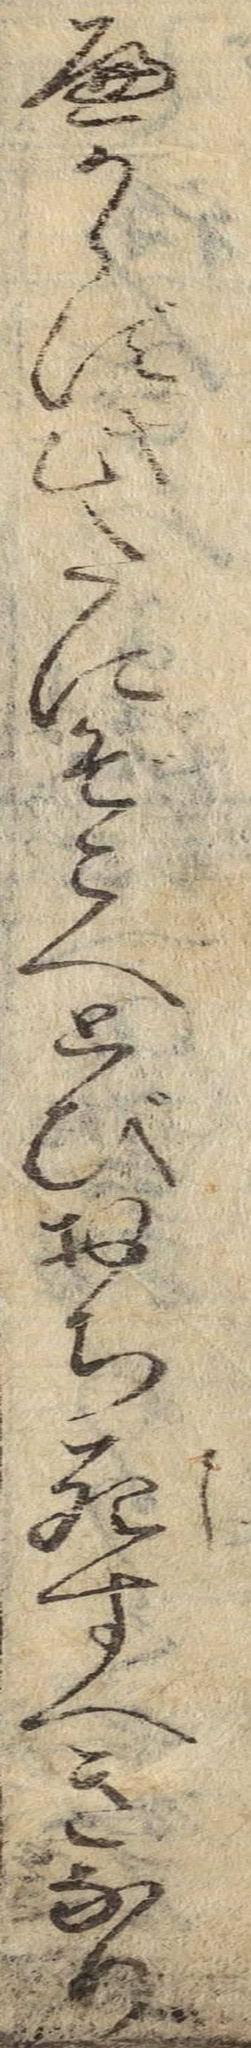へからず。此たにぞこへとびおち死すへきなり

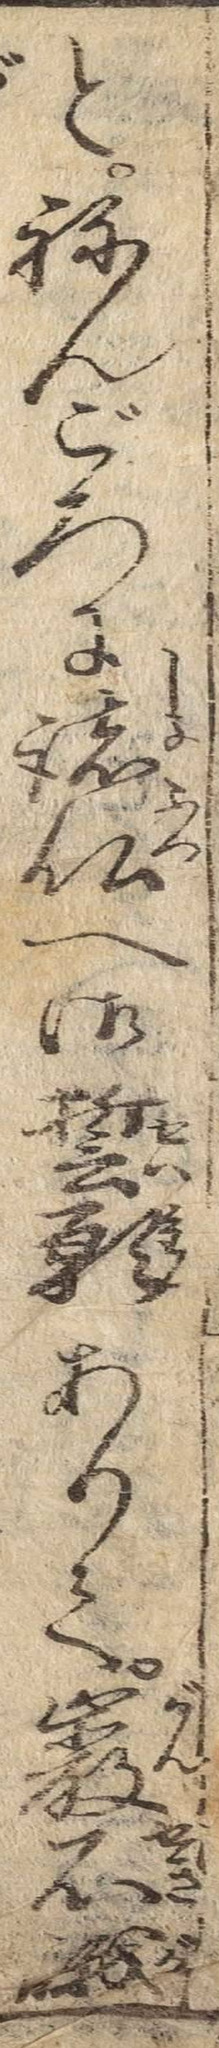とねんごろに諸仏へ誓願ありて。巌石峨
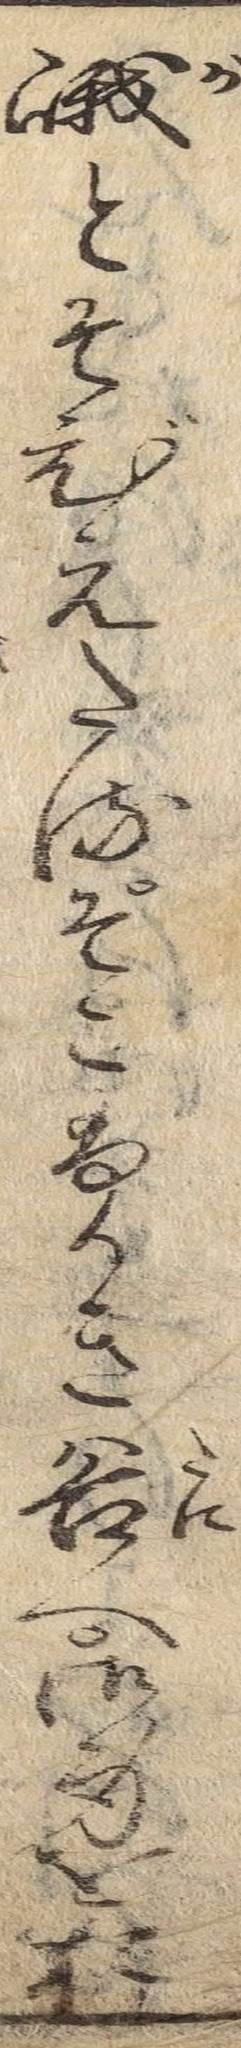峨とそびえたる。そこふかき谷へ。御身をお
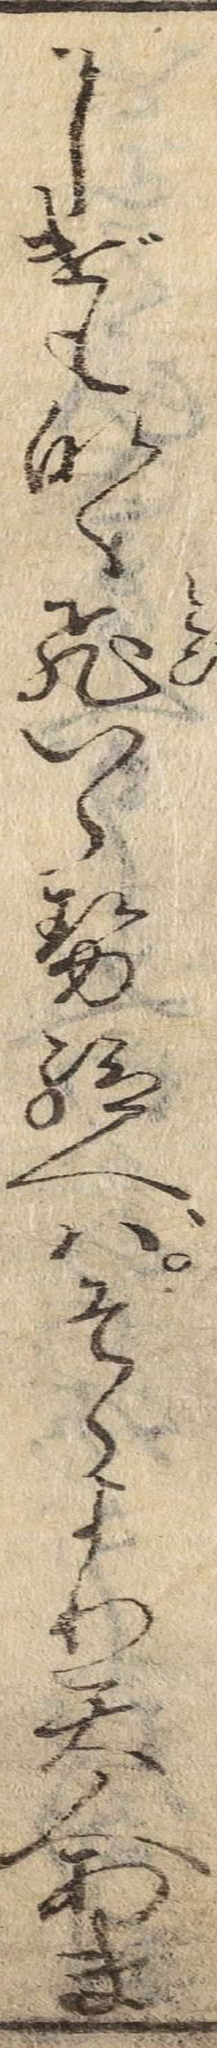しげもなく飛いらせ給へば。そらより天人あま
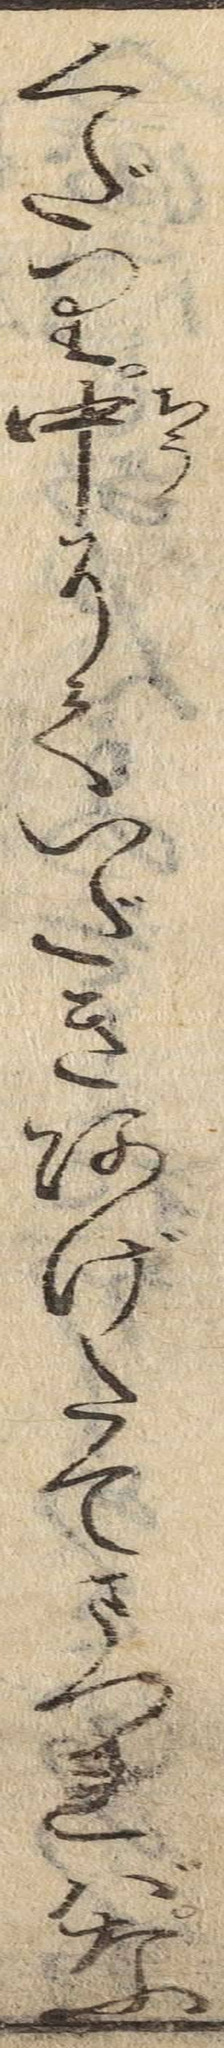くだり中にていだきあげたてまつればな
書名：弘法大師御傳記
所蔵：京都府立京都学・歴彩館 国文学研究資料館
